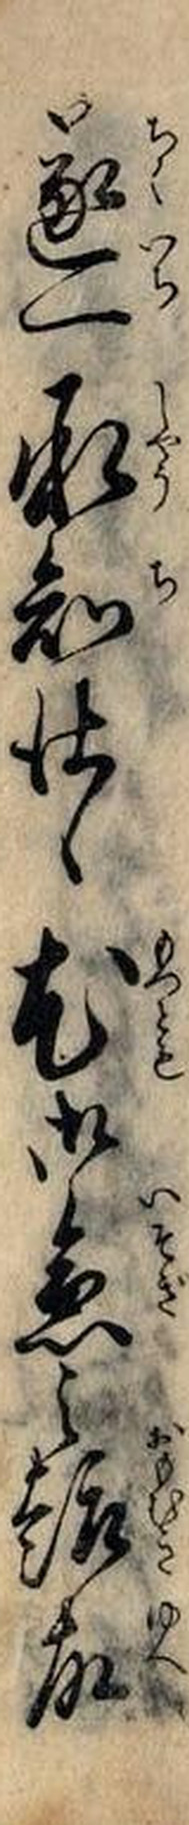逐一承知仕候尤御急之趣故
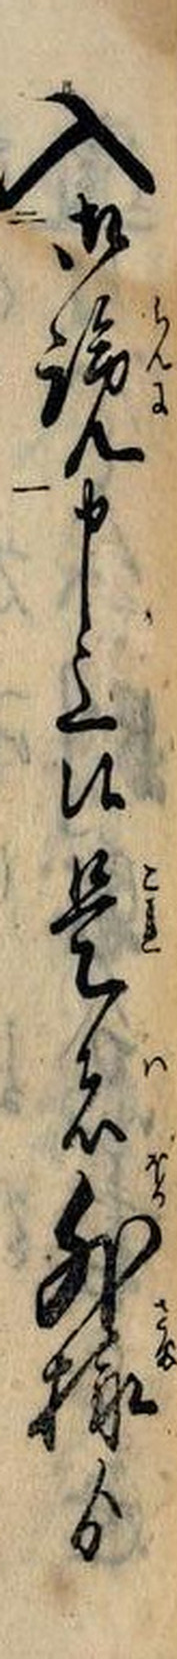入御覧申上候是者外様ゟ
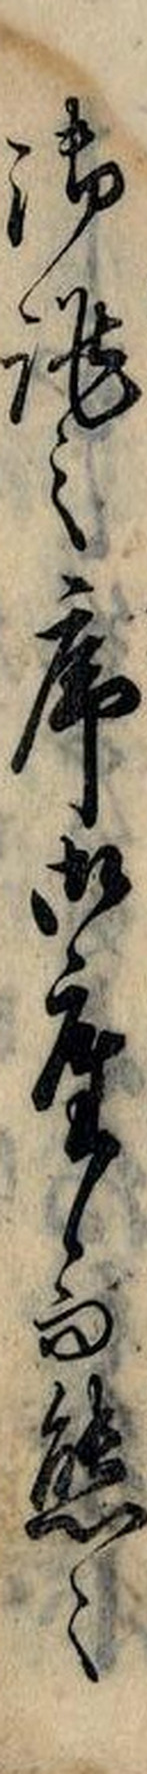御誂之序御座候而態々
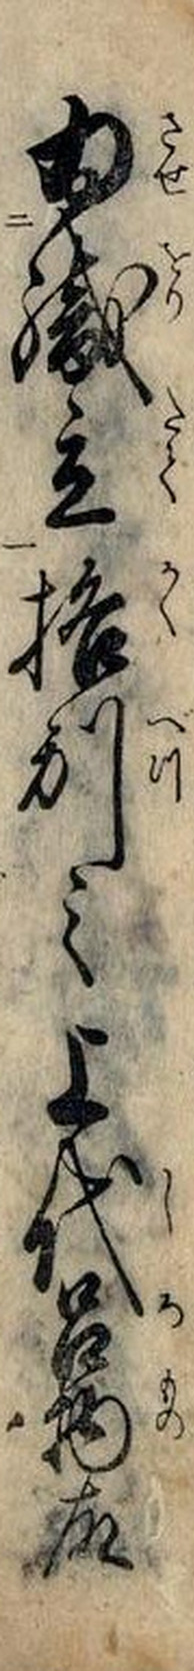為織立格別之上代呂物故
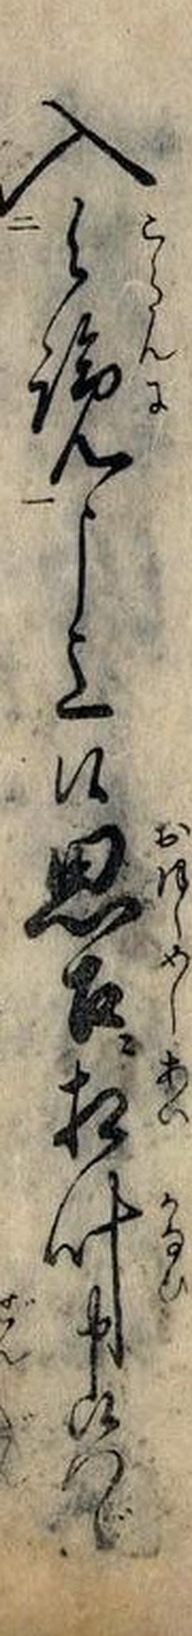入御覧申上候思召に相叶申候はゞ
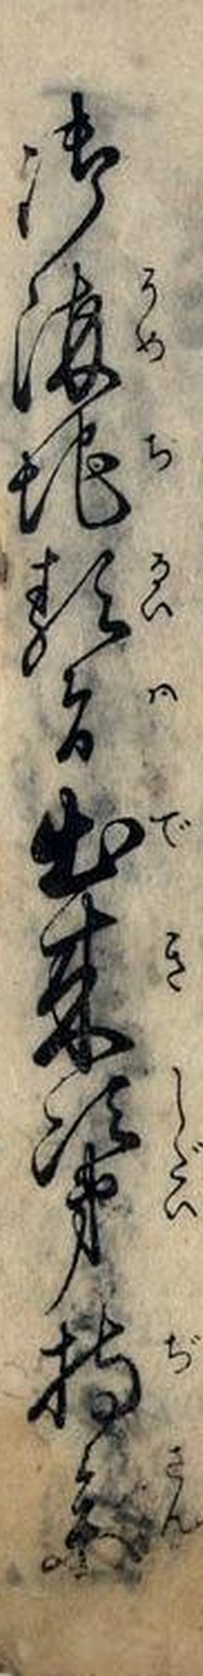御染地類者出来次第持参

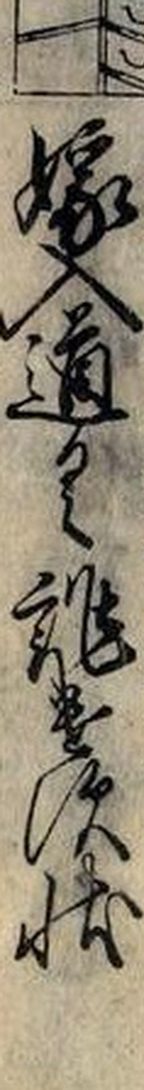嫁入道具誂遣す状
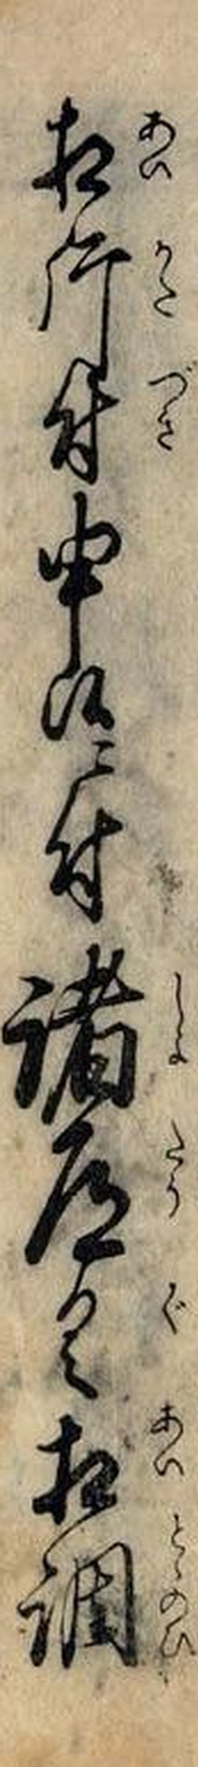相片付申候に付諸道具相調
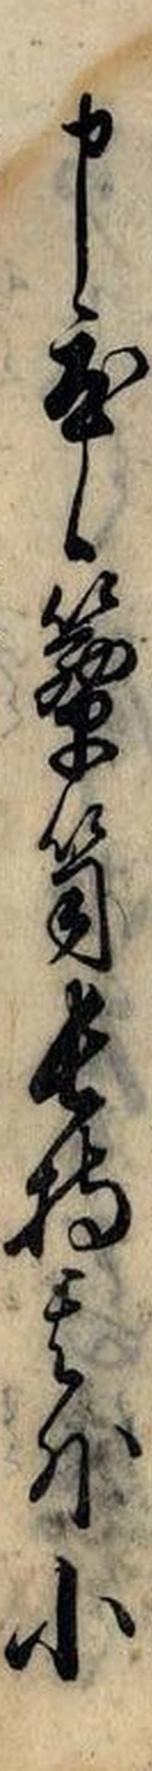申度候箪笥長持其外小
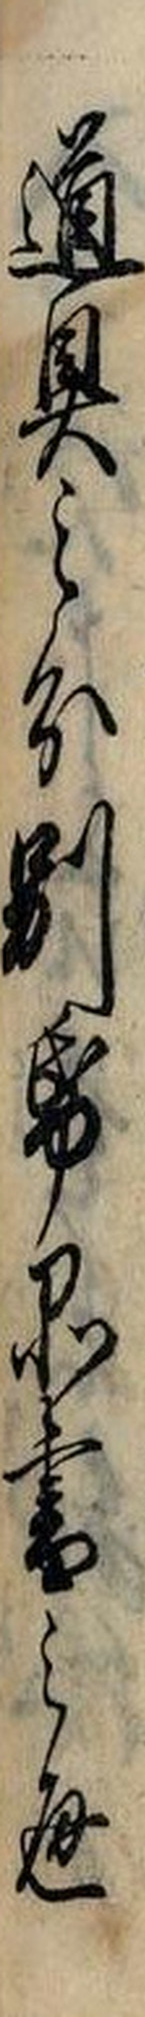道具之分別紙品書之通
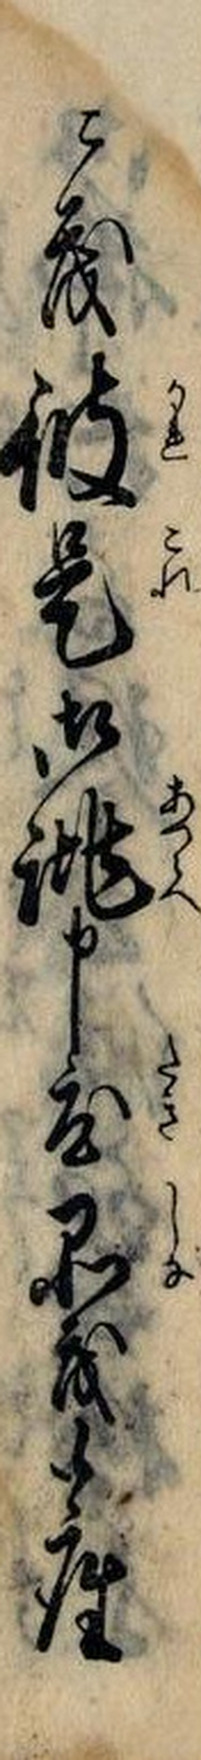にも彼是御誂申度品も御座
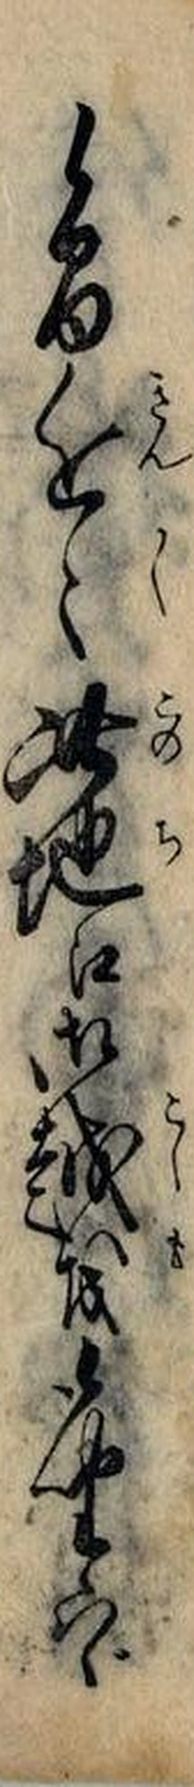候間近々此地江御越も御座候はゞ
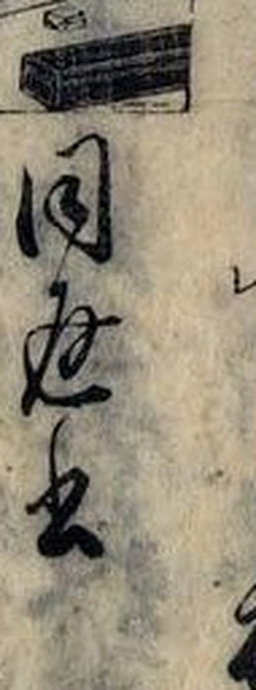同返書
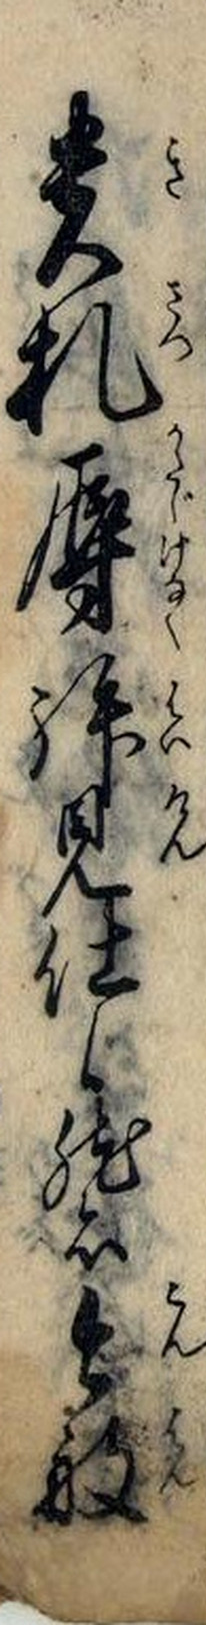貴札辱拝見仕候然者今般

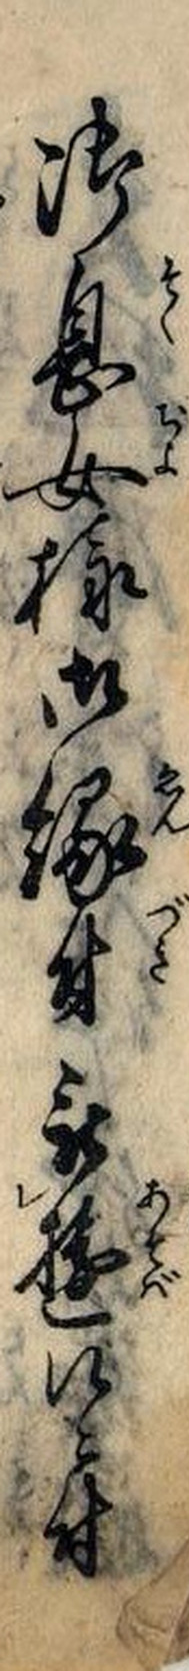御息女様御縁付被遊候に付
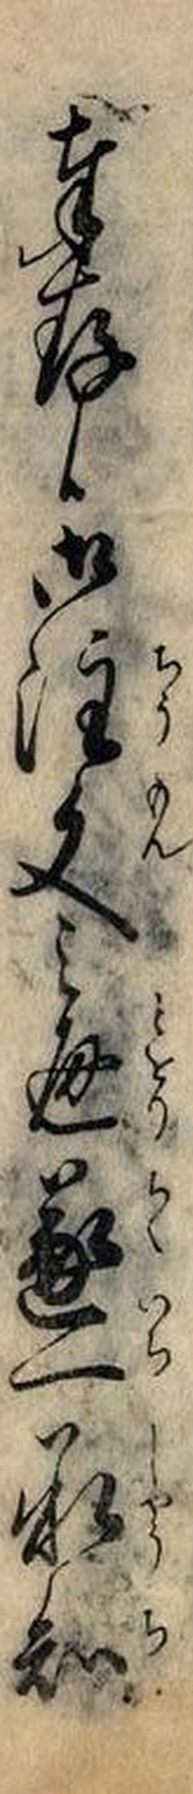奉存候御注文之通逐一承知
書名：大成用文章（往来物）
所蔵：福井県文書館 Fukui Prefectural Archives
